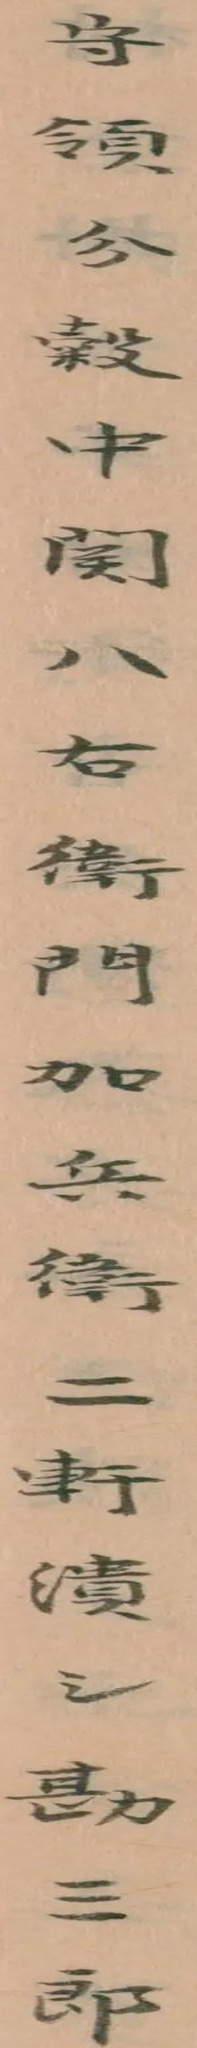守領分穀中関八右衛門加兵衛二軒潰シ勘三郎
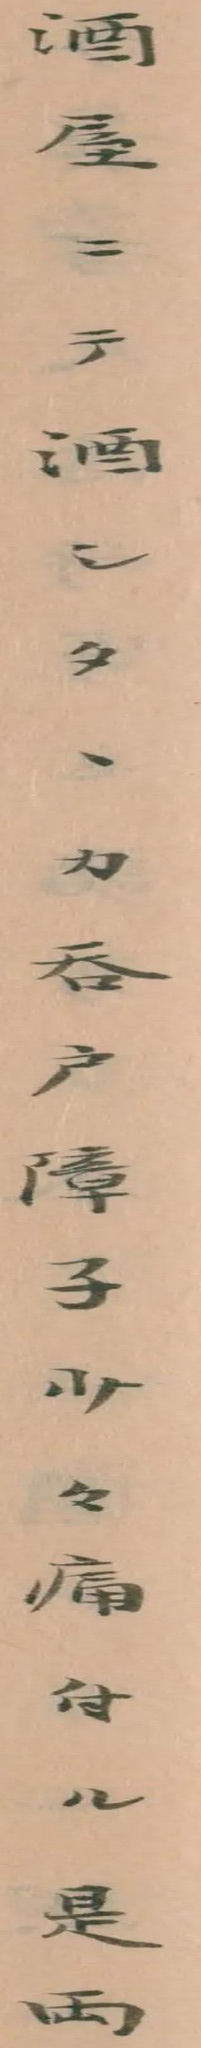酒屋ニテ酒シタゝカ呑戸障子少々痛付ル是両
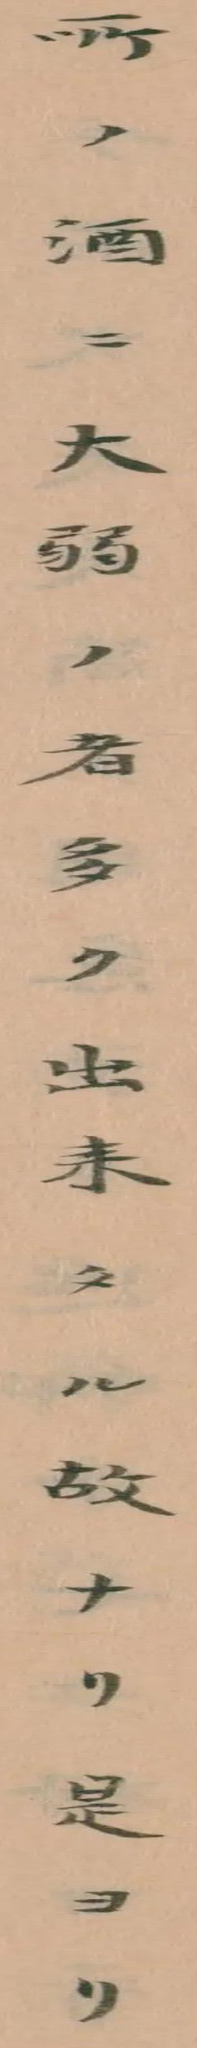所ノ酒二大弱ノ者多ク出来タル故ナリ是ヨリ
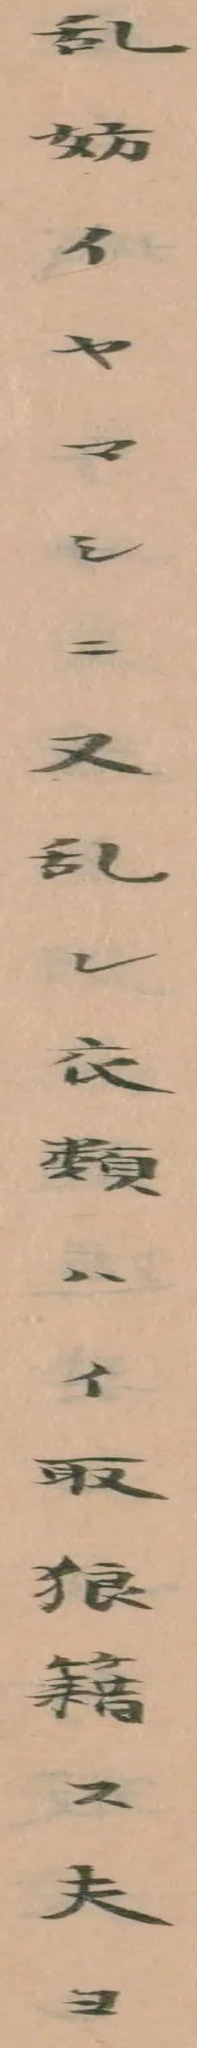乱暴イヤマシニ又乱レ衣類ハイ取狼藉ス夫ヨ
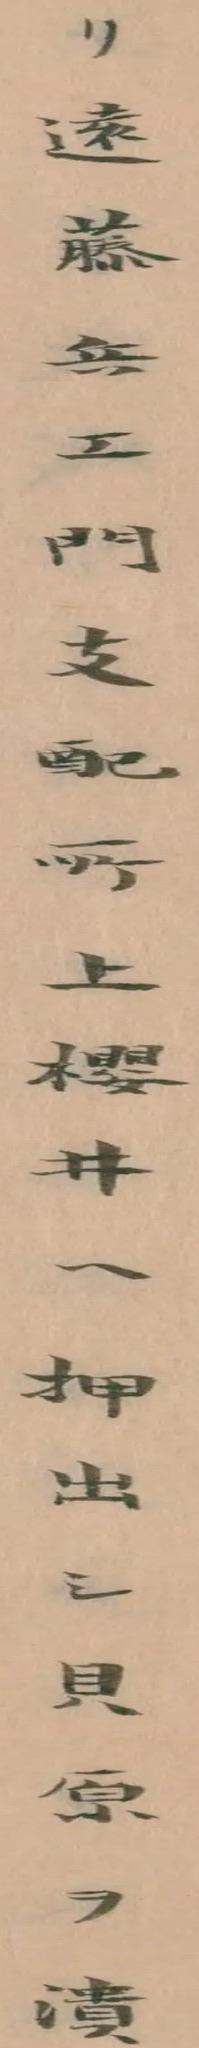リ遠藤兵衛門支配所上桜井へ押出シ貝原ヲ潰
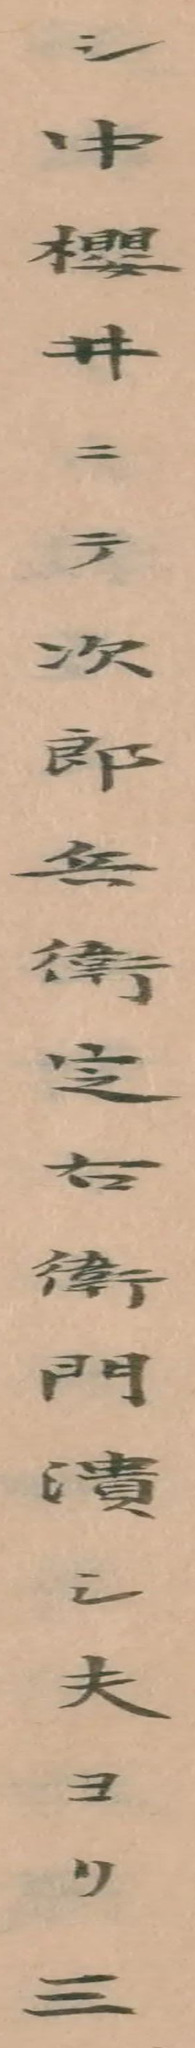シ中桜井ニテ次郎兵衛定右衛門潰シ夫ヨリ三
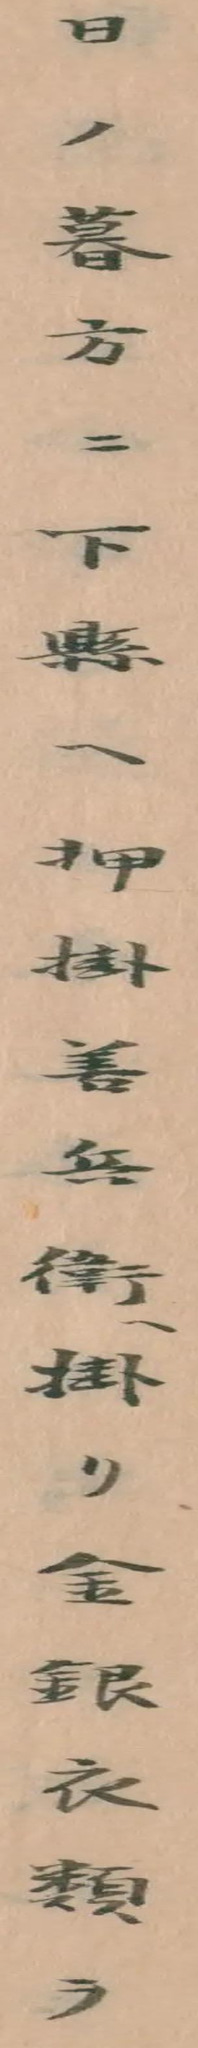日ノ暮方二下県へ押掛善兵衛へ掛り金銀衣類ヲ
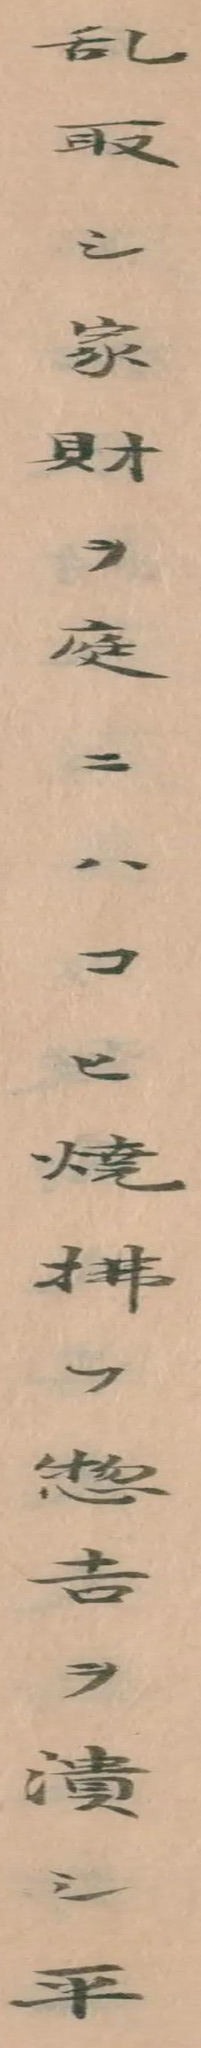乱取シ家財ヲ庭二ハコヒ焼払フ惣吉ヲ潰シ平
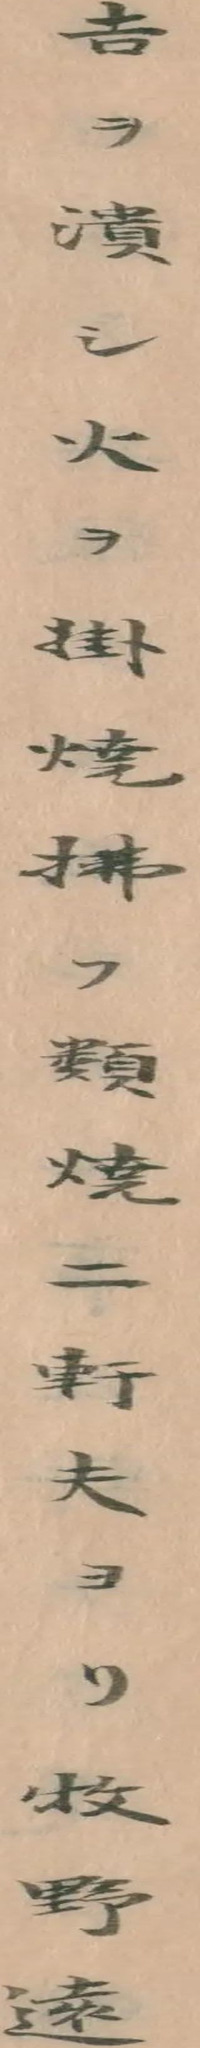吉ヲ潰シ火ヲ掛焼払フ類焼二軒夫ヨリ牧野遠
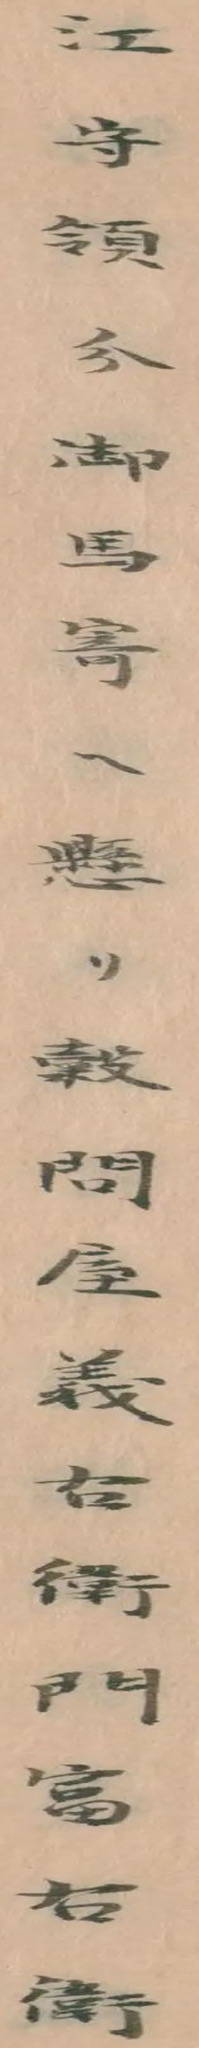江守領分御馬寄へ懸り穀問屋義右衛門富右衛
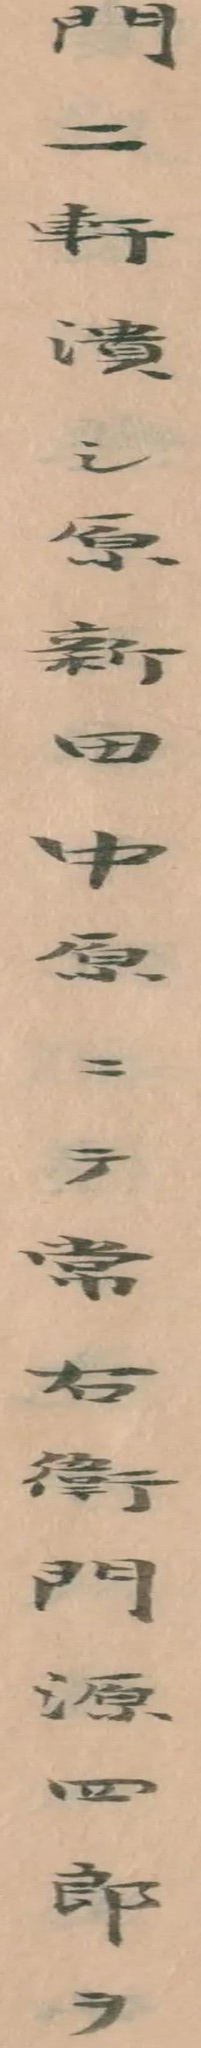門二軒潰シ原新田中原ニテ常右衛門源四郎ヲ

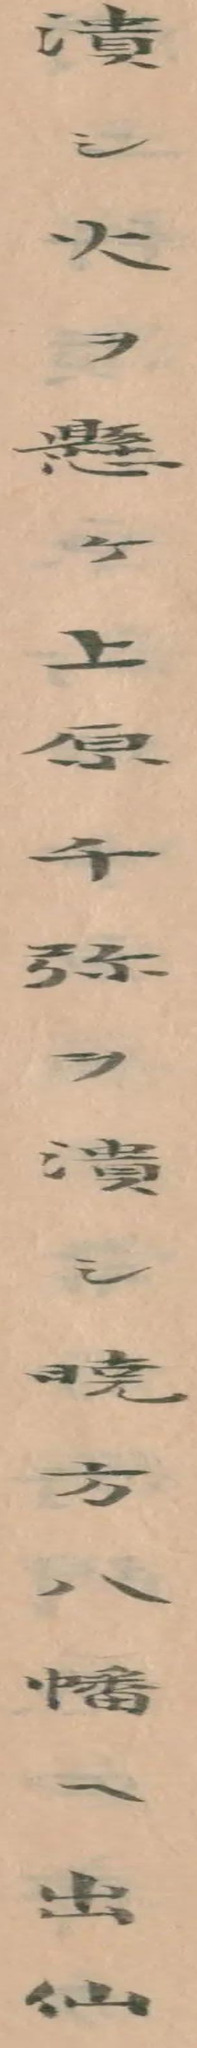潰シ火ヲ懸ヶ上原千弥ヲ潰シ暁方八幡へ出仙
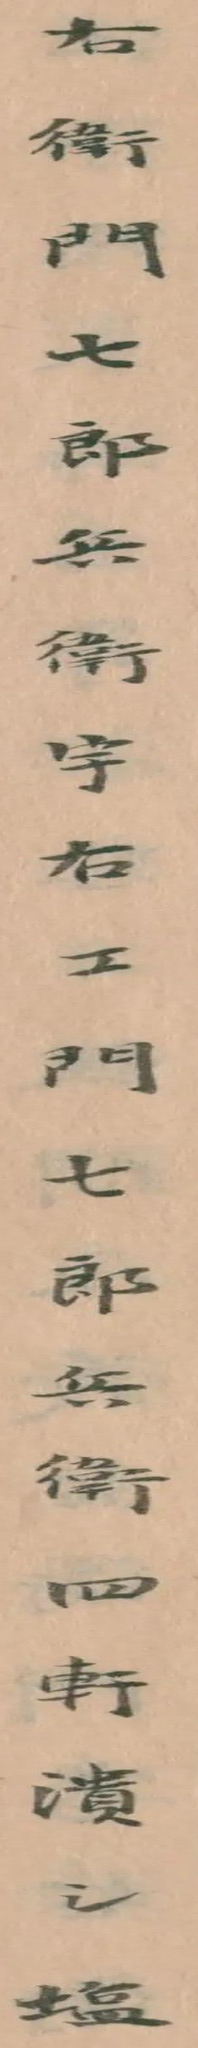右衛門七郎兵衛宇右衛門七郎兵衛四軒潰シ塩
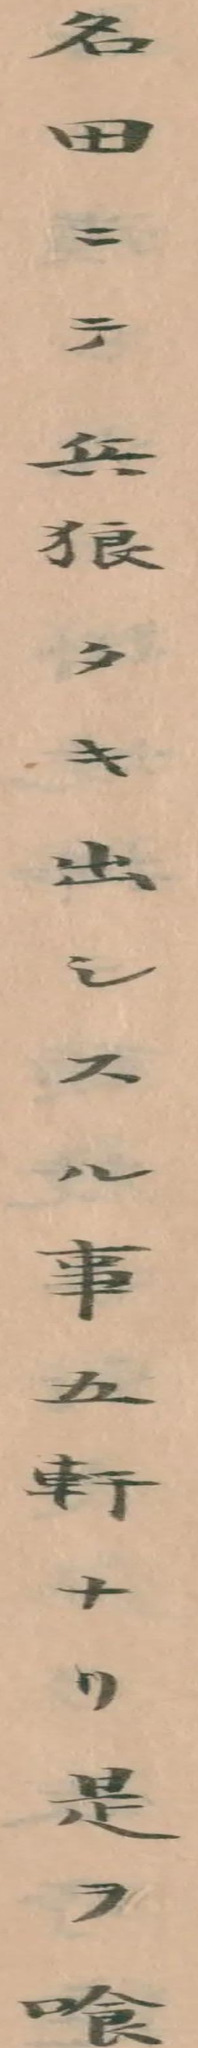名田ニテ兵狼タキ出シスル事五軒ナリ是ヲ喰
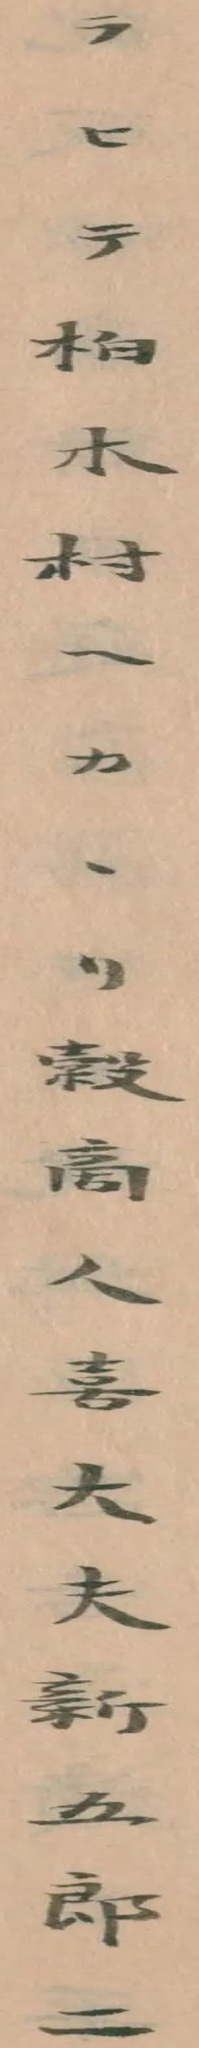ラヒテ柏木村へカゝリ穀商人喜太夫新五郎二
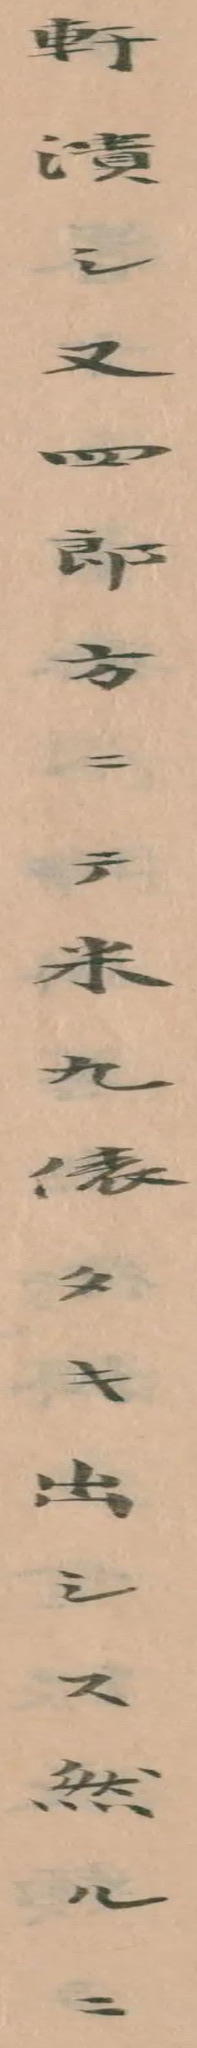軒潰シ又四郎方ニテ米九俵タキ出シス然ル二
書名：地災撮要. 巻3(地震之部)-巻4(噴火之部)
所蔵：国立国会図書館 National Diet Library, JAPAN
